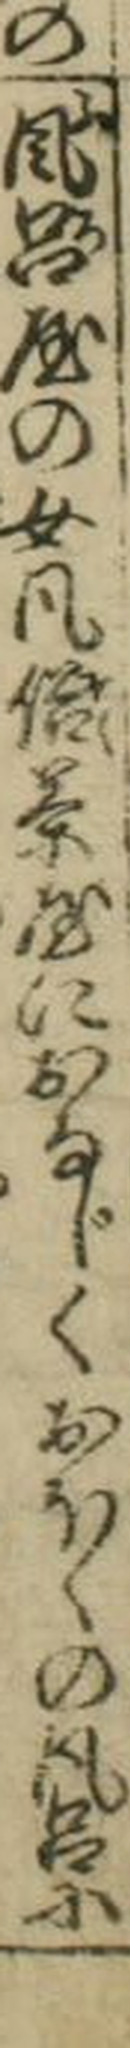風呂屋の女風俗茶屋におなじくおほくの風呂に
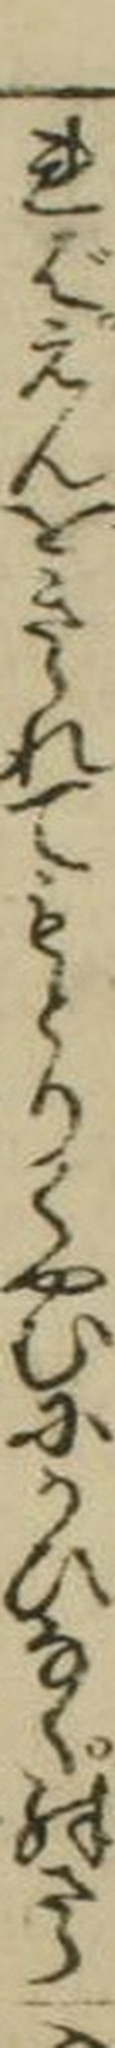れば。えんをきられてもとりくやむにかひなく。殊さら
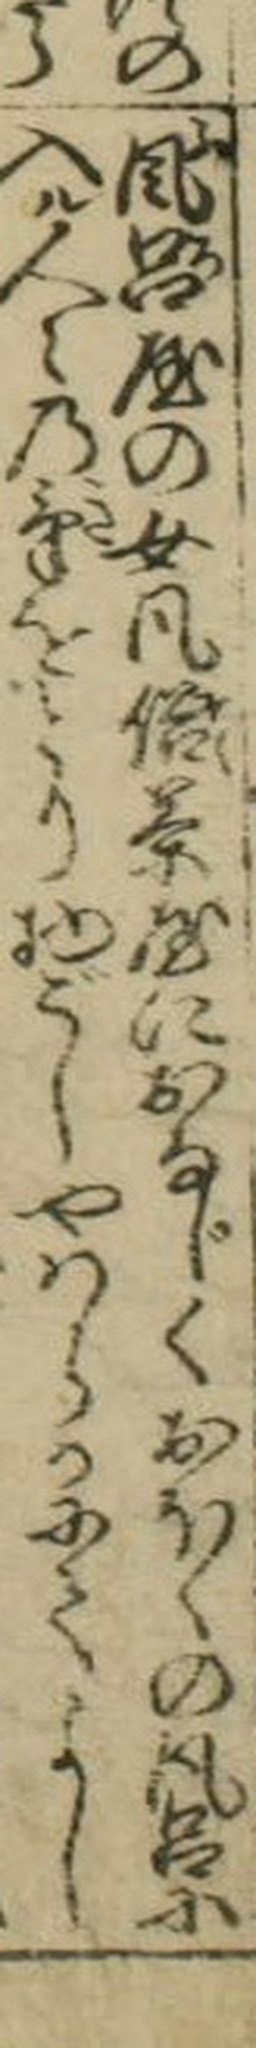入ル人々の氣をとり物ごしやはらかにてよし
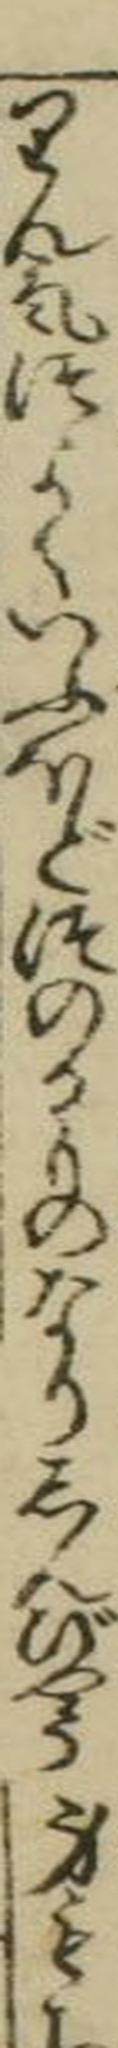りん気つよくいふほどつのるものなりしんびやう
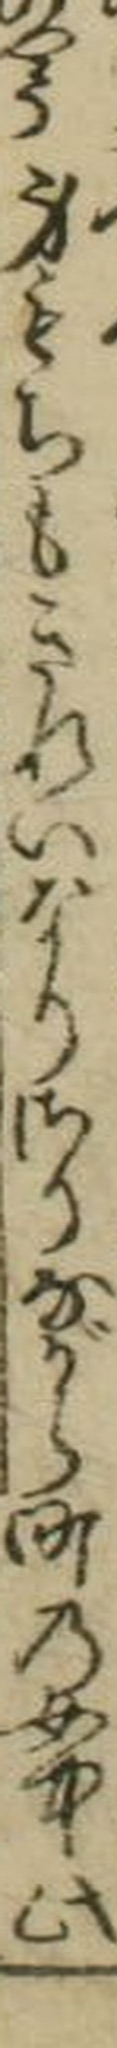身もちもきれいなりさりながら町の女中此
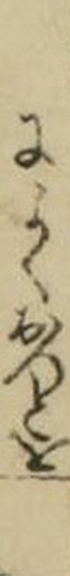によくおつとを
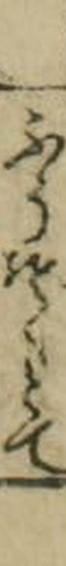ふうぞくとて
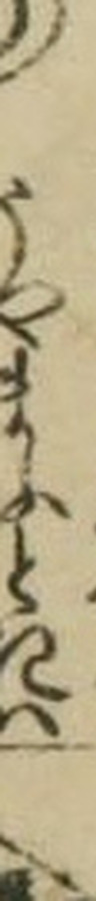うやまふときは
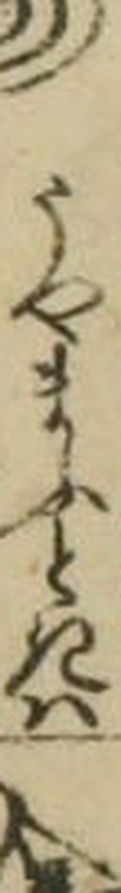うやまふときは
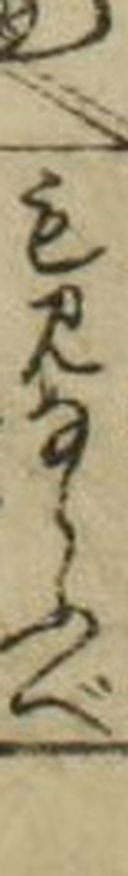も見ならふべ
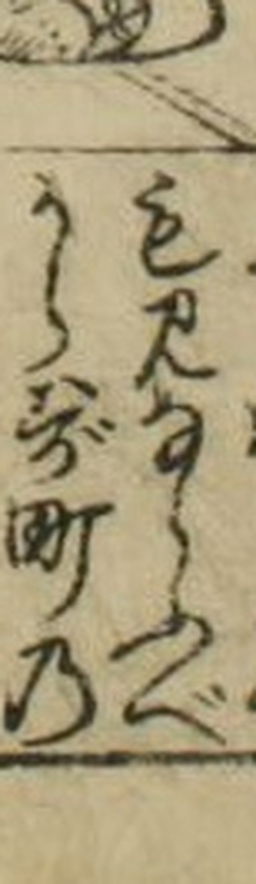からず町の
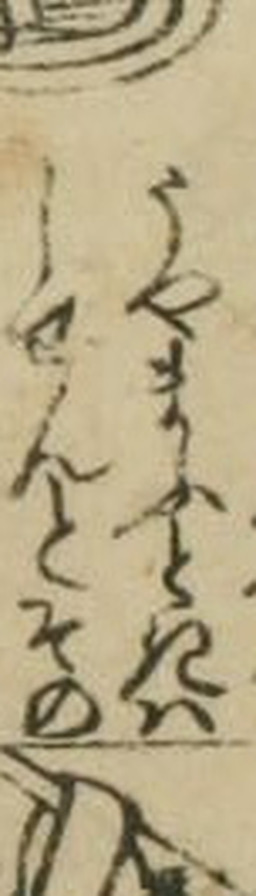しぜんとその
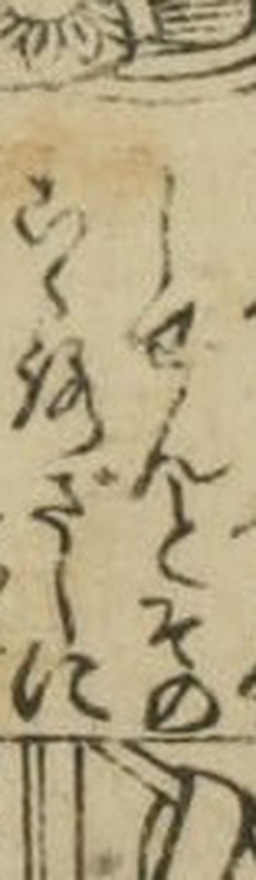こゝろざしに
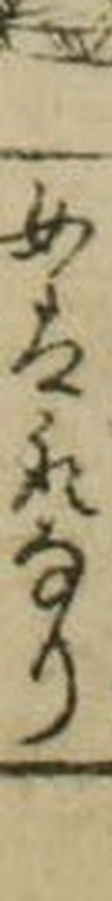女は外なり
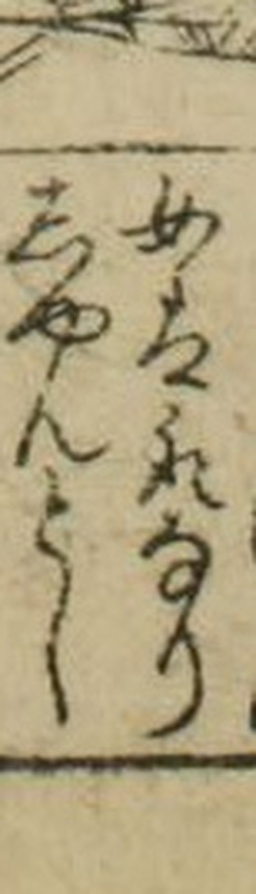しやんとし
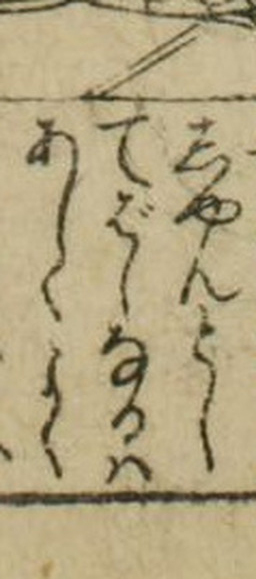てばしなるは
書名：女源氏教訓鑑
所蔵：東京学芸大学附属図書館
